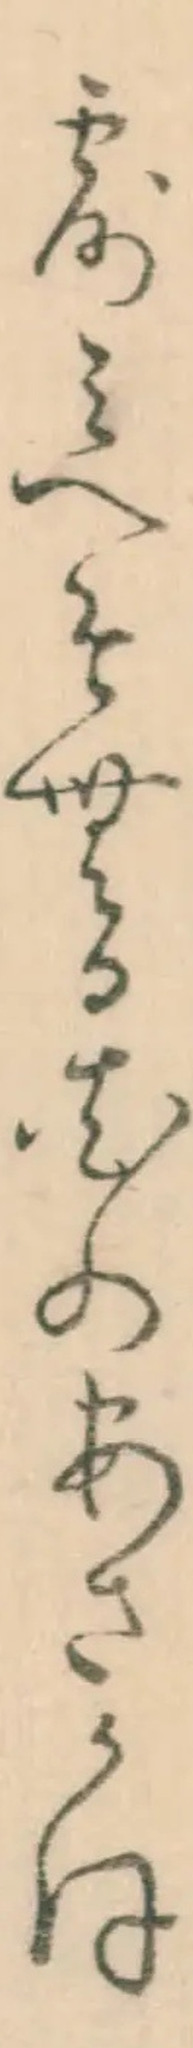露ミへそむる花のあさかほ
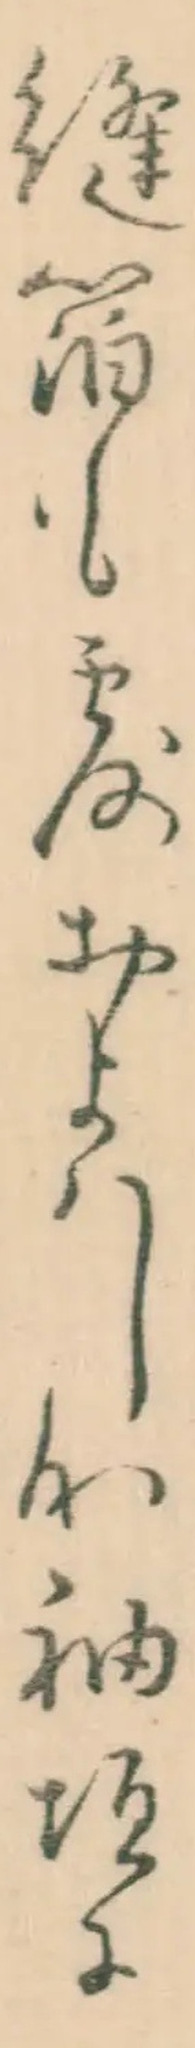縫箔も露およハしや袖頃に蟹丸
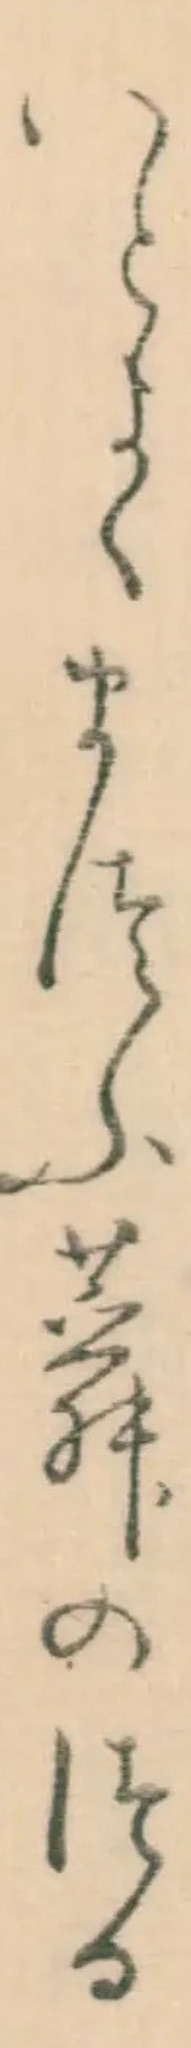いとよくまとふ舞のつる

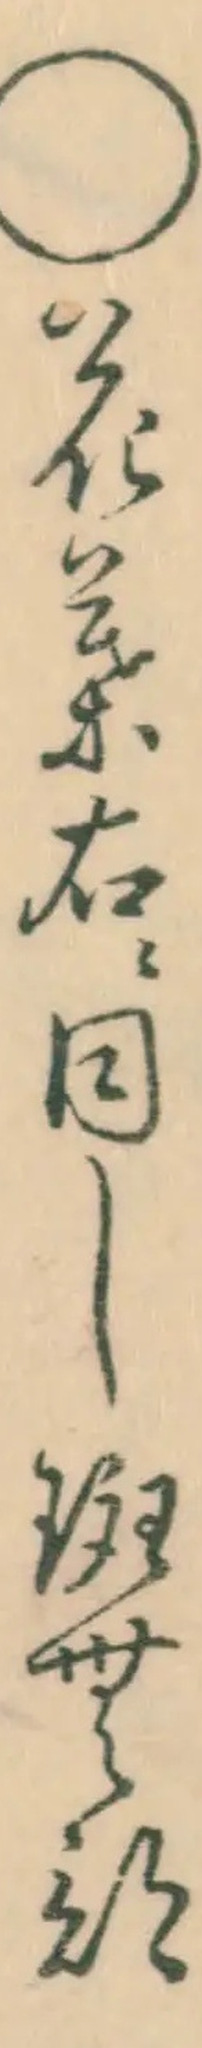〇花葉右ニ回し斑無部
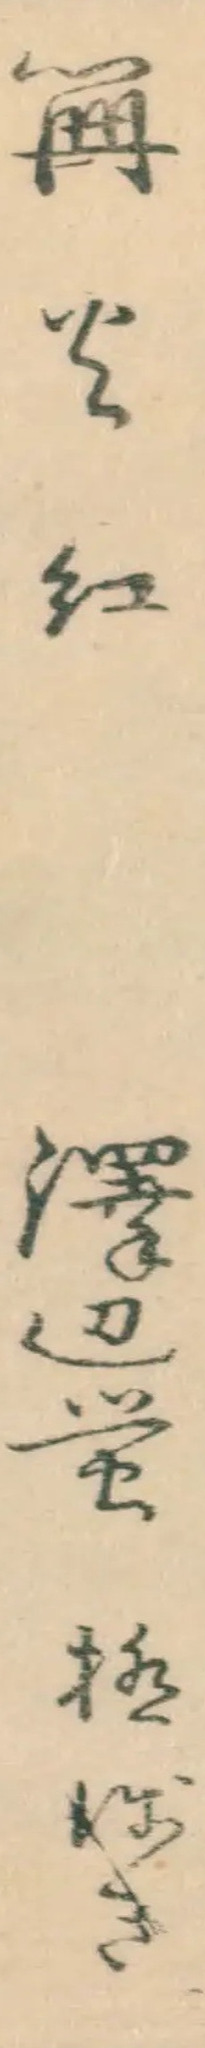篝火紅沢辺蛍極浅き
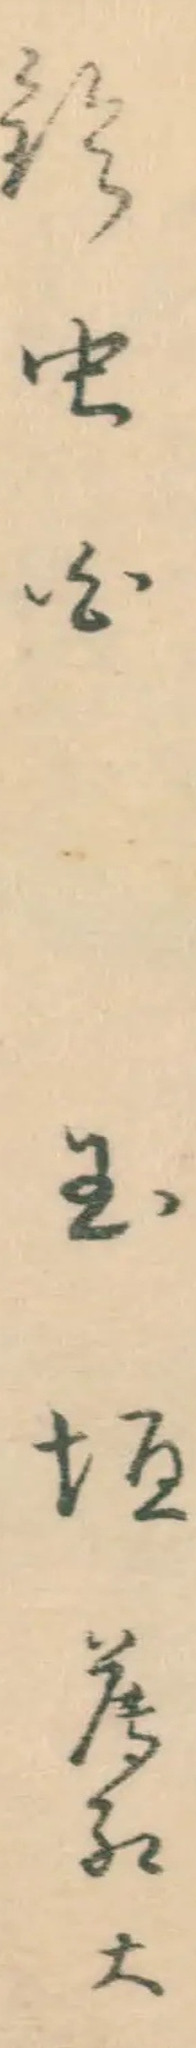鈴虫花玉垣薄紅大
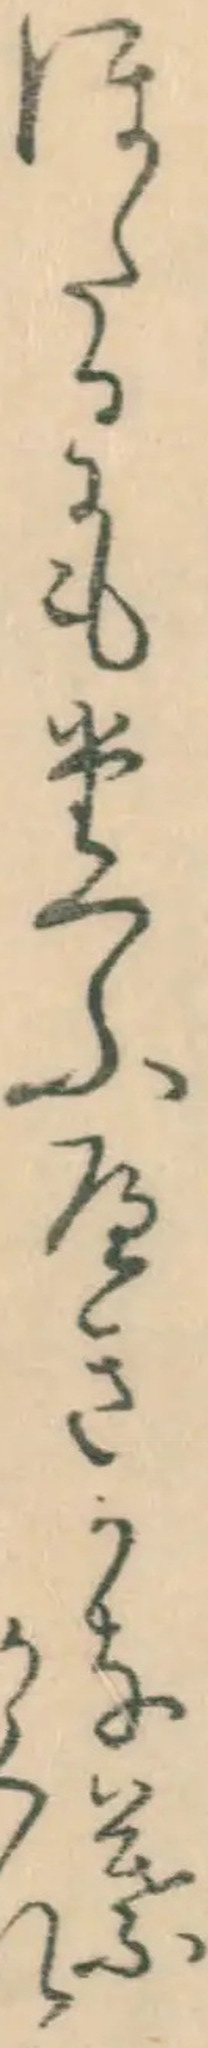ほたるにもたへふ道きかな葉
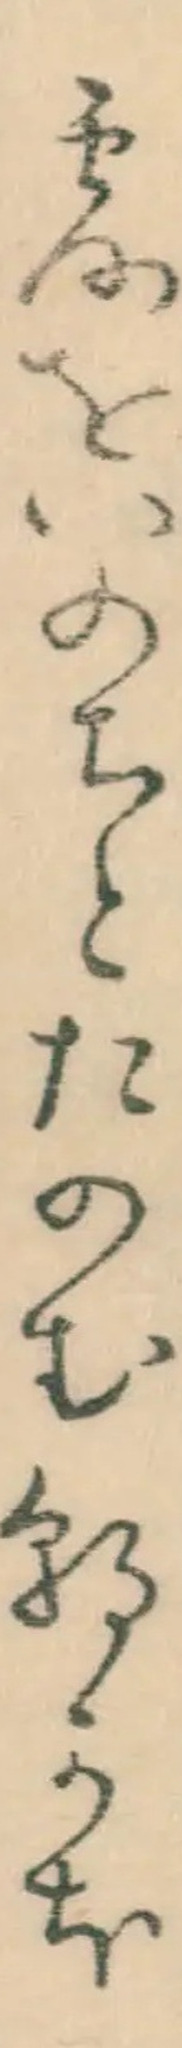露をいのちとたのむ朝かほ

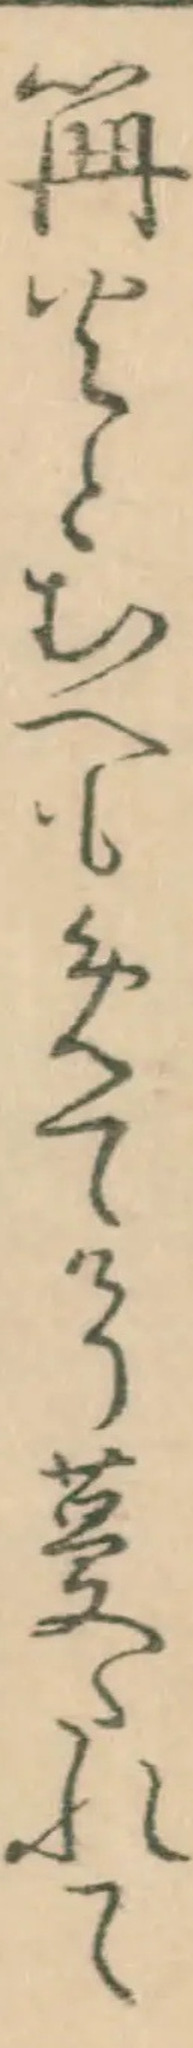篝火とむへもめてけり菱たれて
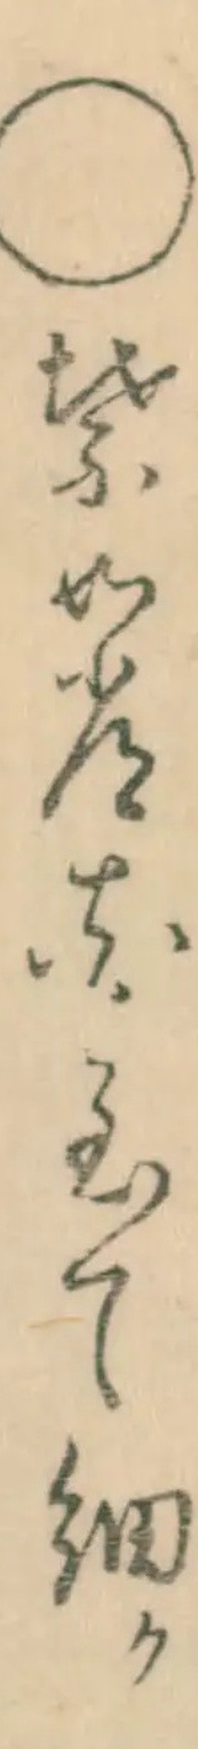〇紫如常花至て細ク
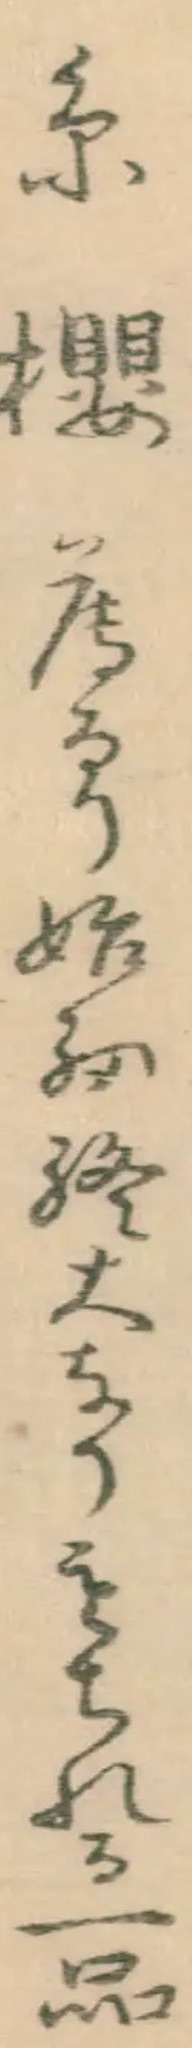糸桜薄るり始細終大なりちれる一品
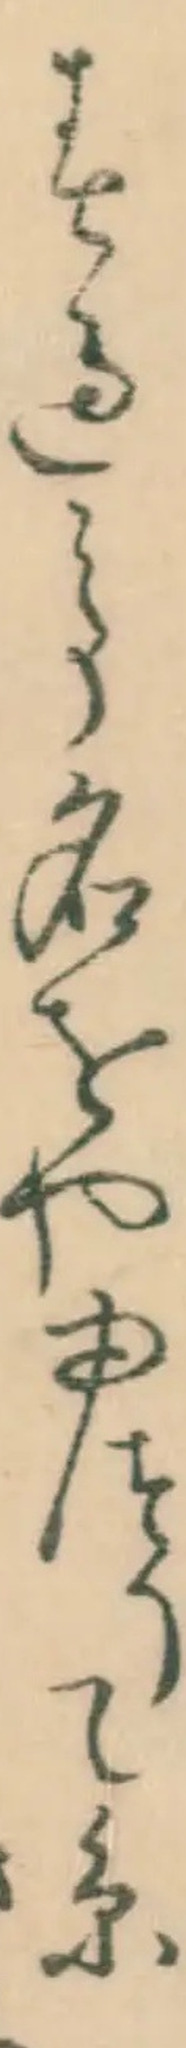春過て名をや申せりて糸
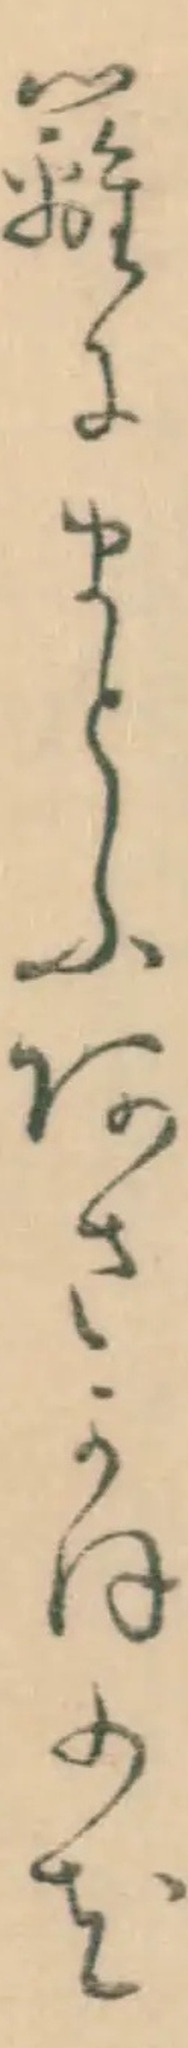籬にまとふあさかほの花

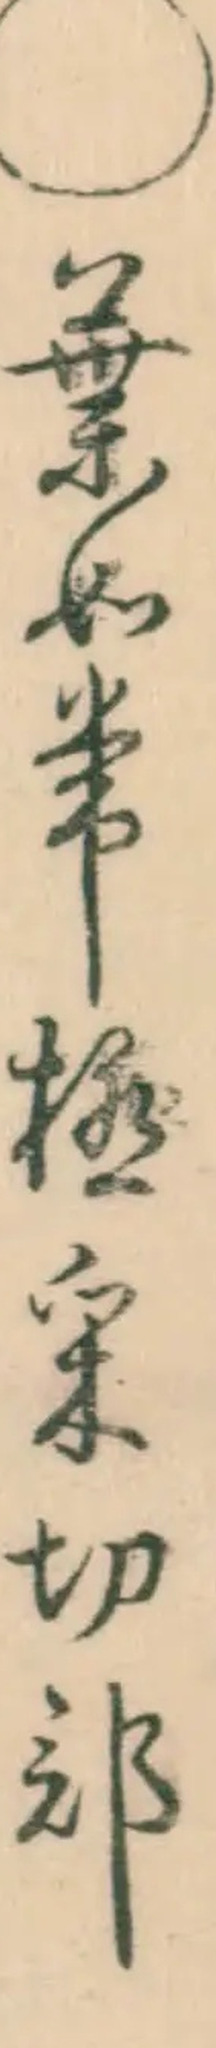〇葉如常極釆切部
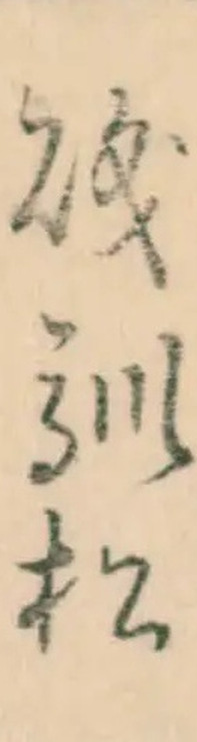蝶馴松
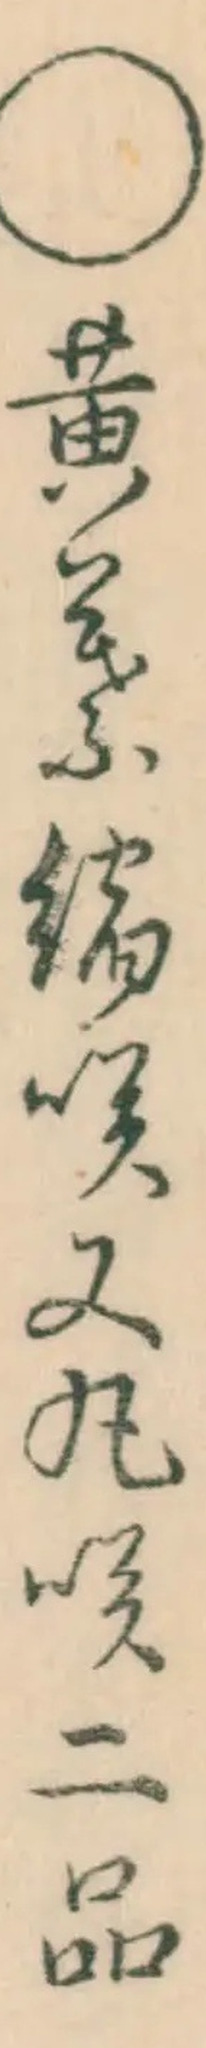〇黄葉縮咲又丸咲二品
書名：花壇朝顔通 2巻. [2]
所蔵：国立国会図書館 National Diet Library, JAPAN
